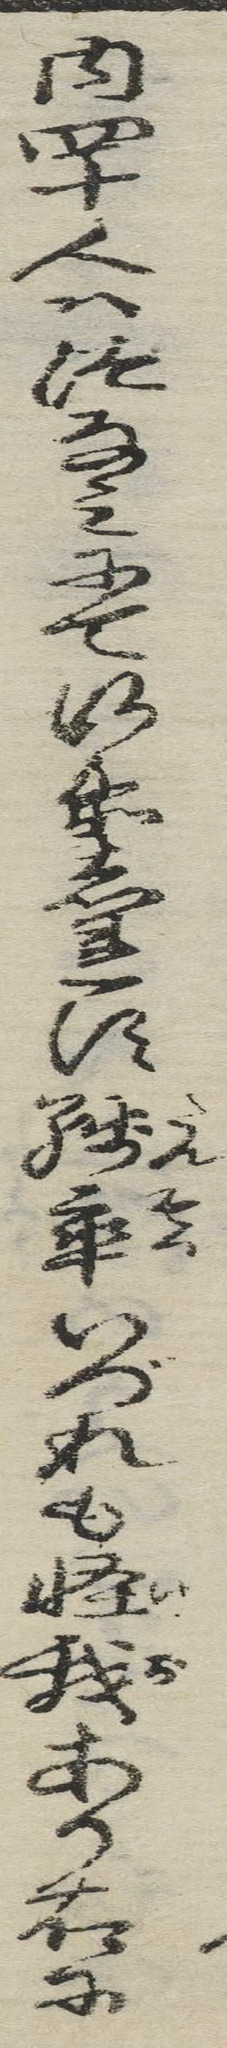内四十人はつなみにて行衛しれす残卒いづれも怪我あり右に
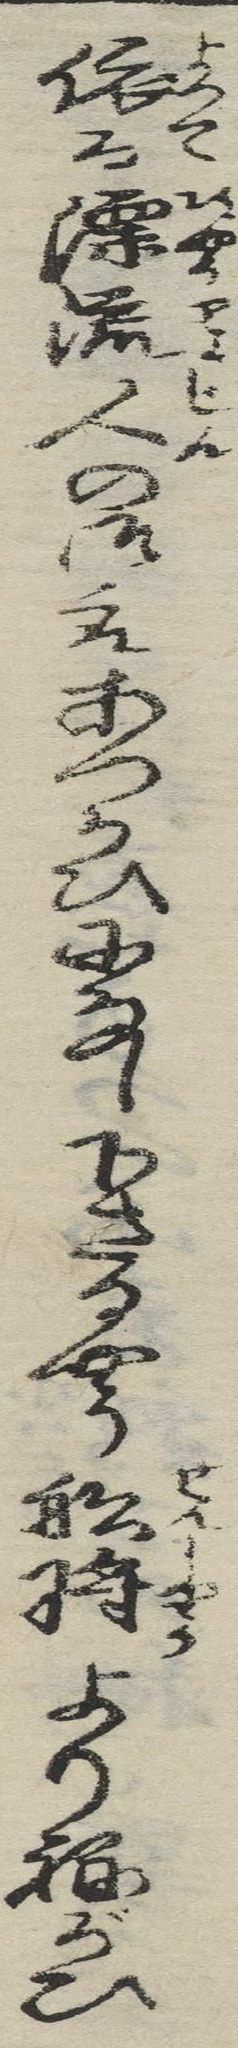依而漂流人の御取あつかひになし下さるやう船将よりねがひ

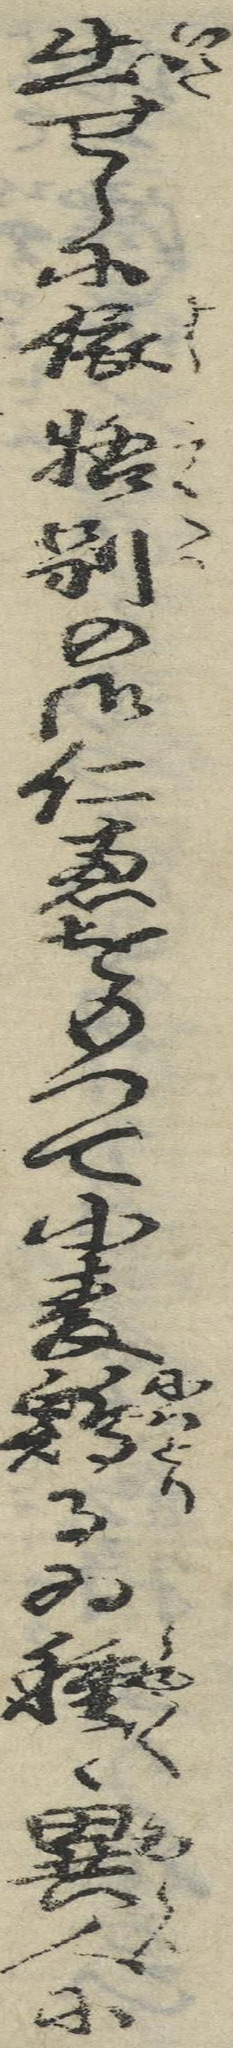出せしに依格別の御仁恵をもつて小麦鶏るゐ種々異人に
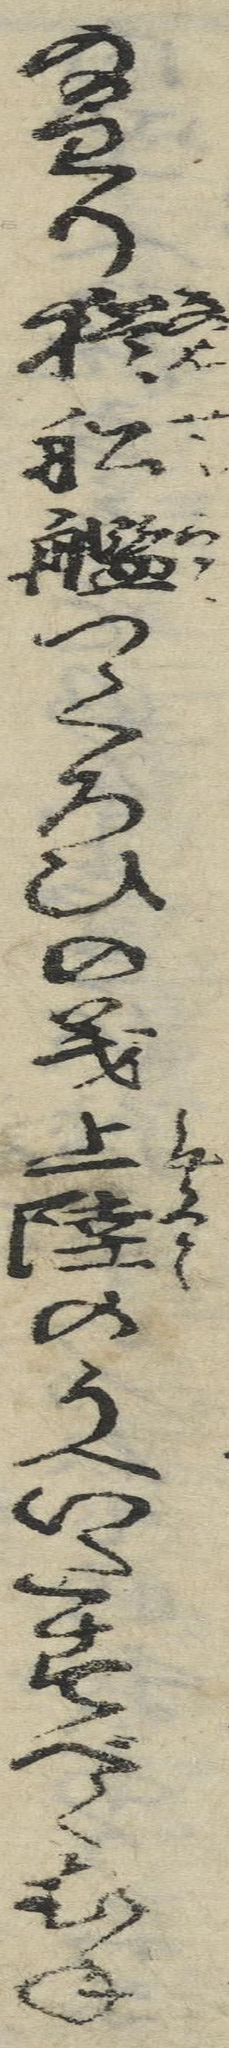給わり猶戦艦つくろひの義上陸のうへいたすべくむね
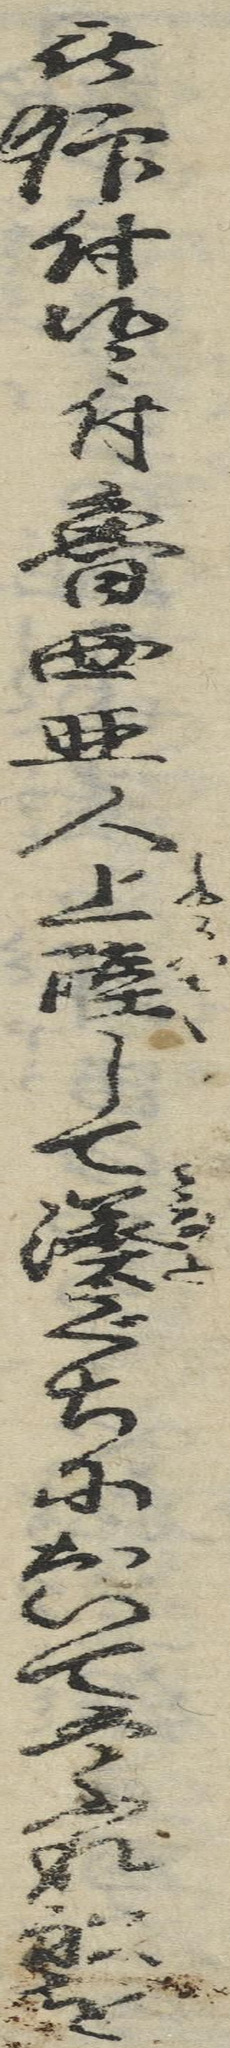被仰付候ニ付魯西亜人上陸して湊ぐちにおいてやふれ船を
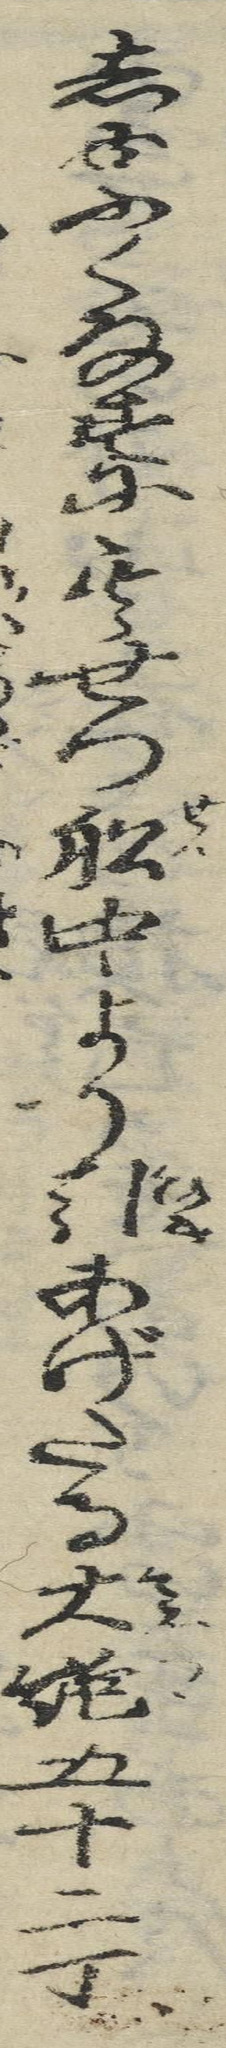しゆふくなすに其せつ船中より引あげたる大砲五十二丁
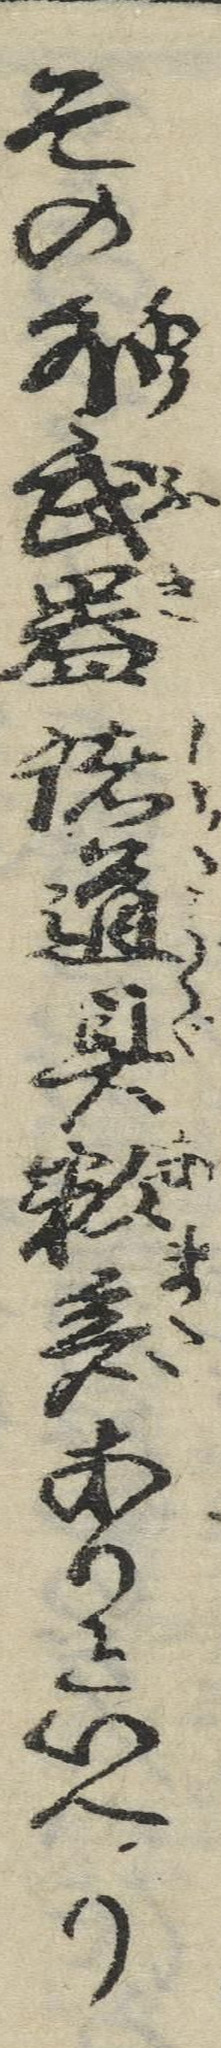その外武器諸道具数多ありといへり
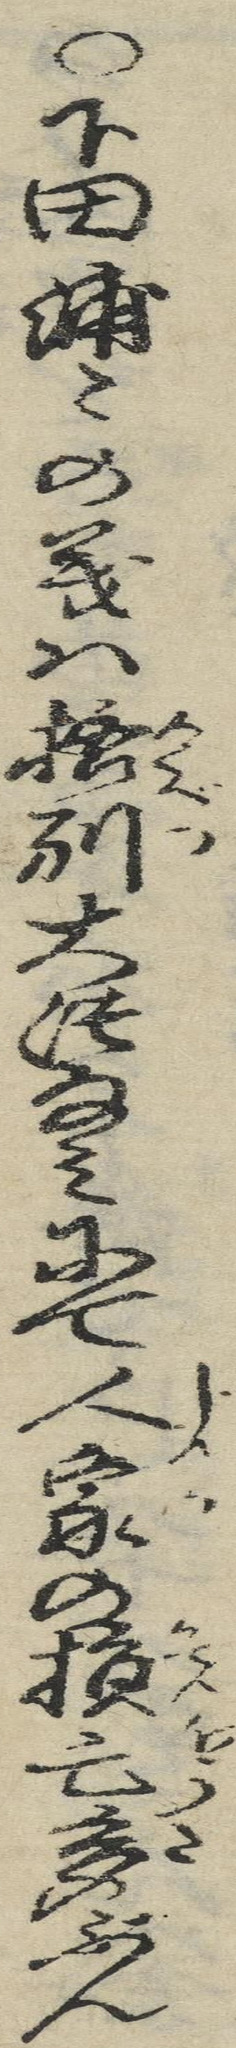◯下田浦との義は格別大つなみにて人家の損亡多ぶん
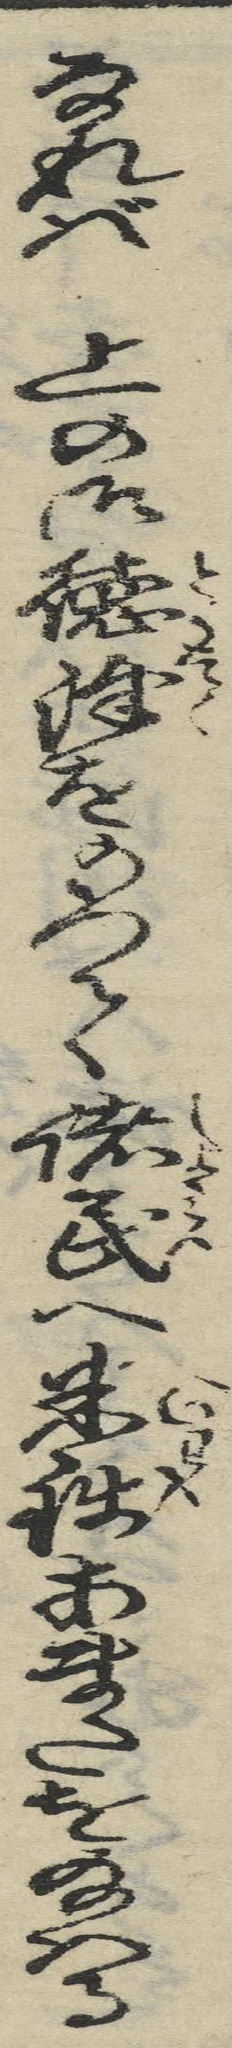なれば上の御徳沢をもつて諸民へ米銭あまたを給はる
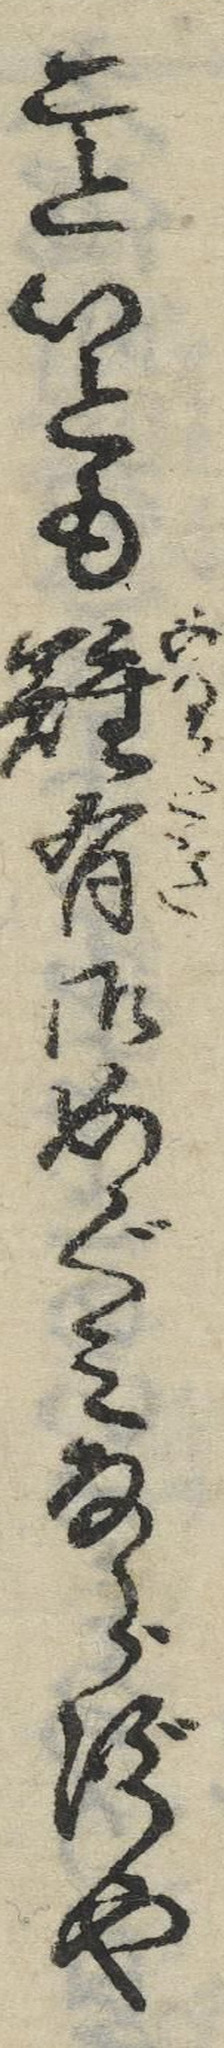こといとも難有御めぐみならずや
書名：諸国海辺地震津波書
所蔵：東京大学地震研究所図書室 Earthquake Research Institute Library, The University of Tokyo, JAPAN
